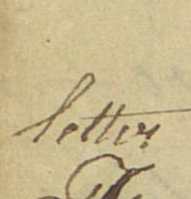letter
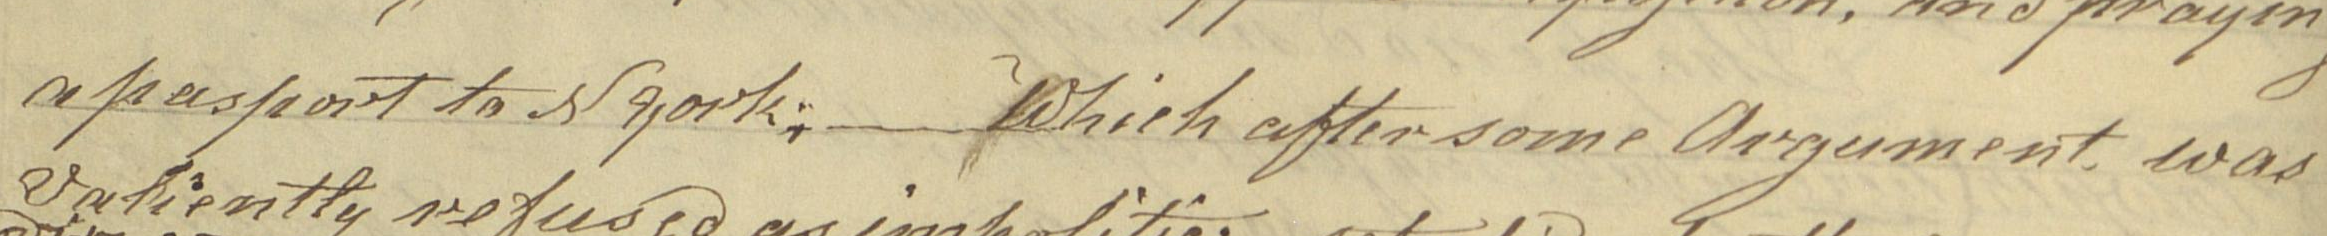a pasport to N York; Which after some Argument was
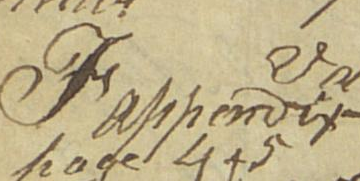F appendix
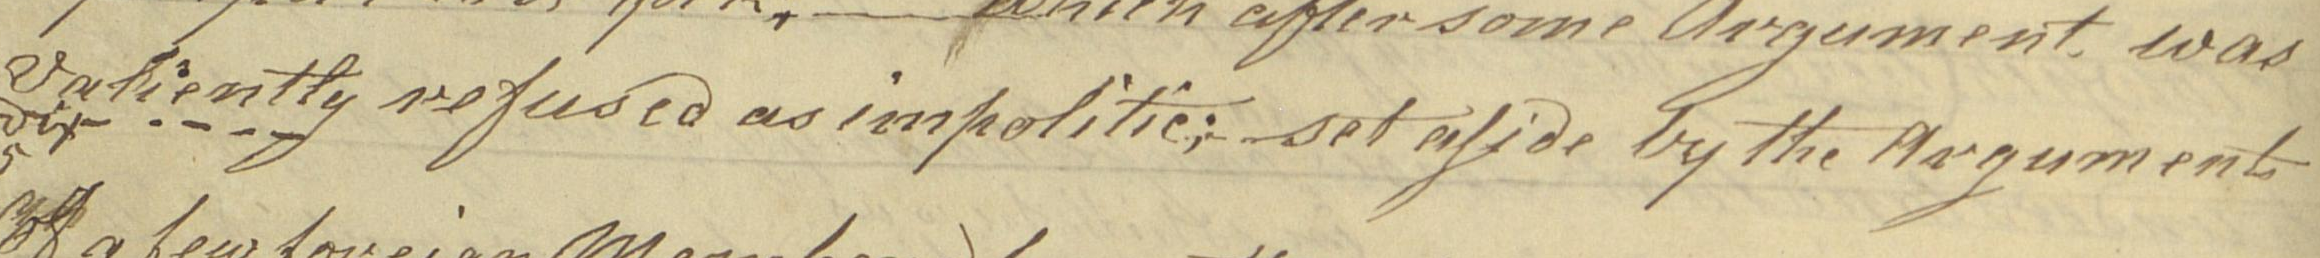valiently refused as impolitic; set aside by the Argument
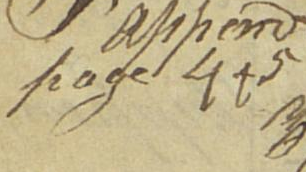page 4 + 5
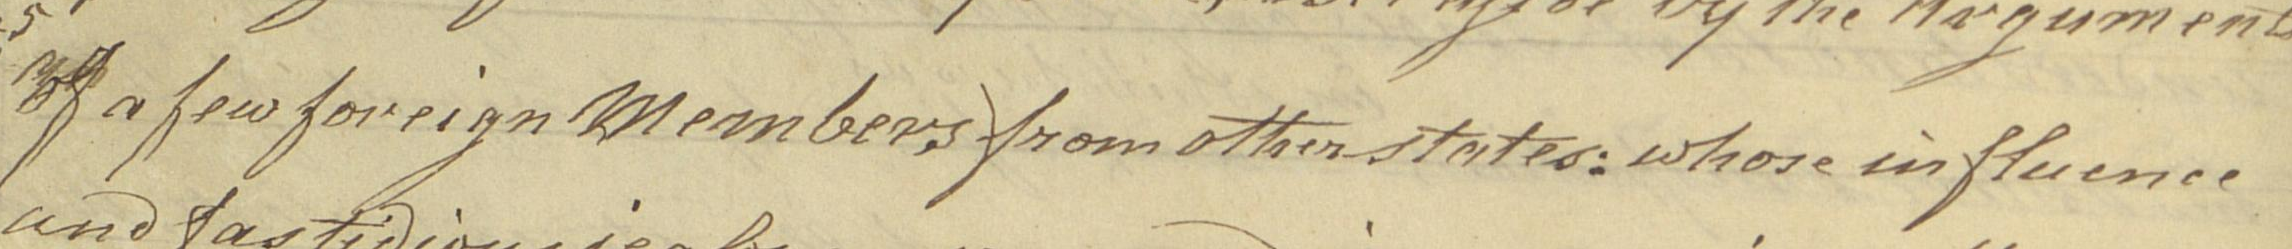of a few foreign Members from other states; whose influence
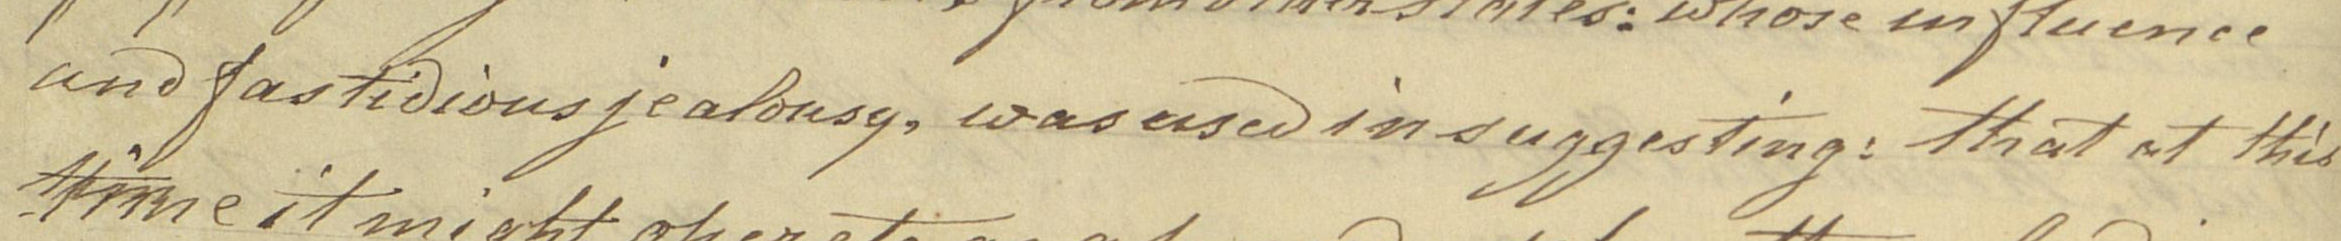and fastidious jealousy. was used is suggesting, that at the
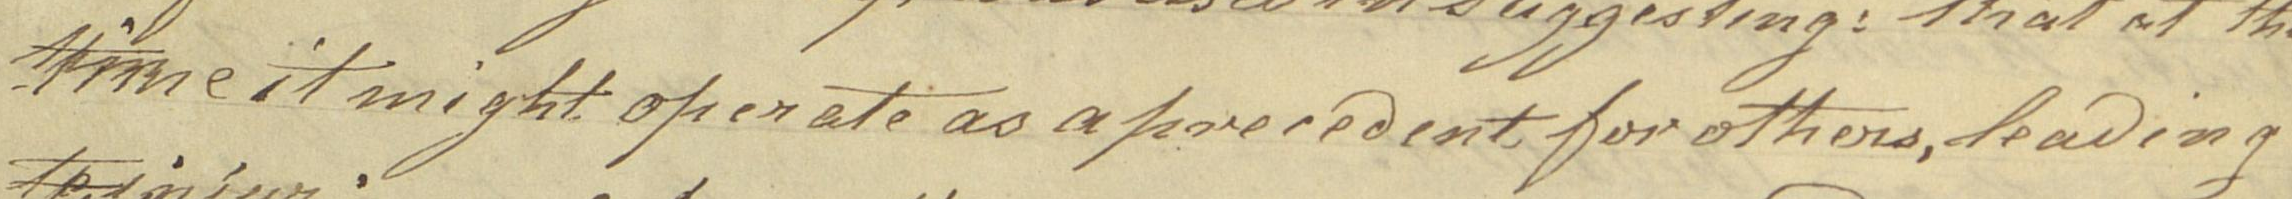time it might operate as a precedent for others, having
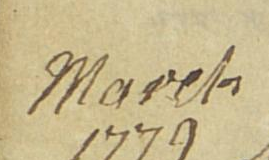March
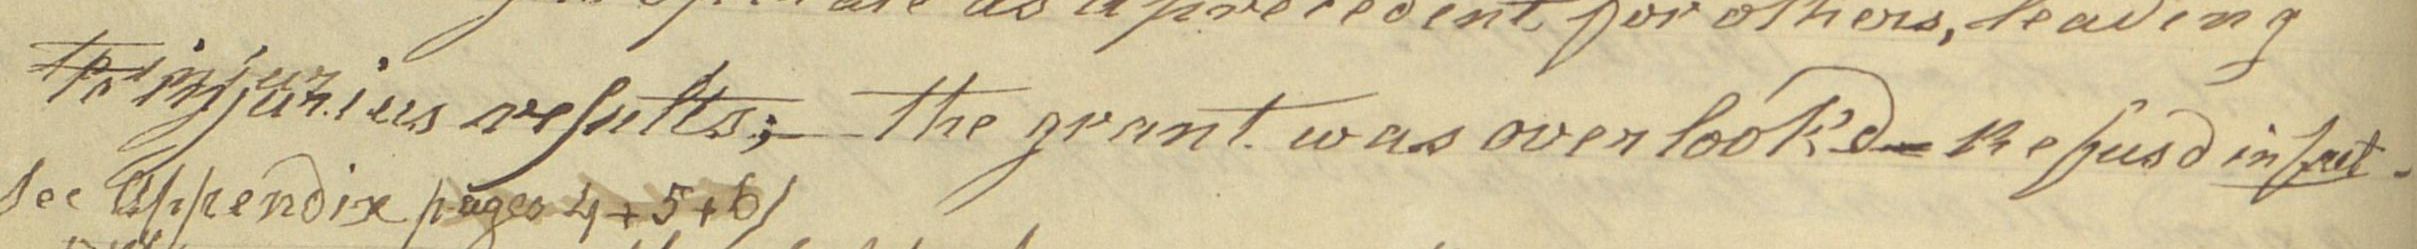to injuries results; the grant was overlook'd refusd inpet-
